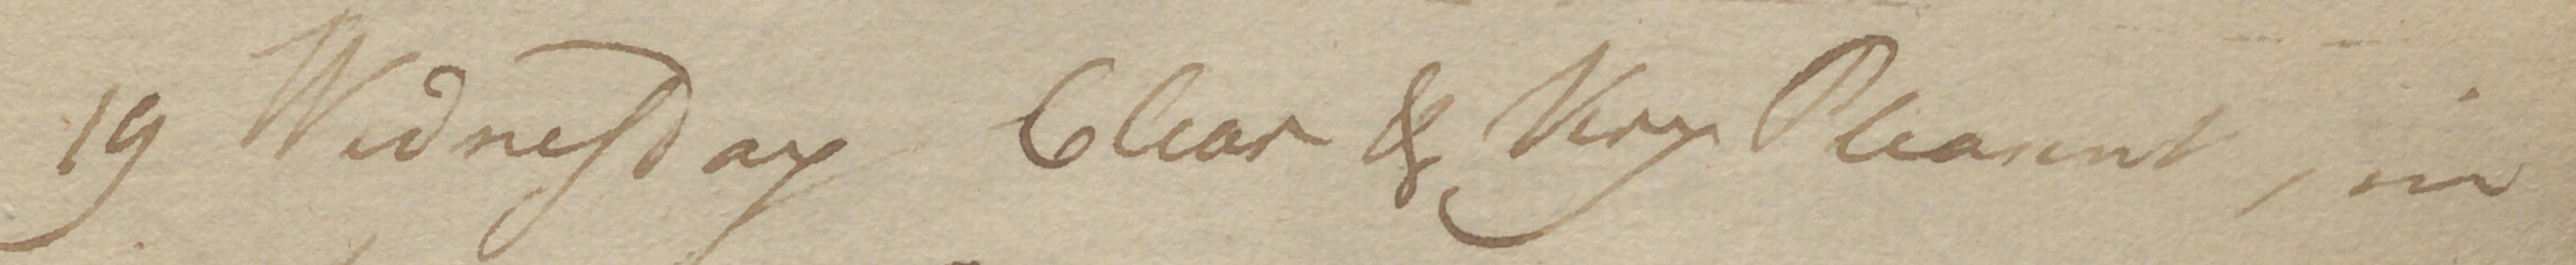19 Wednessay Clear & Very Pleasent, in
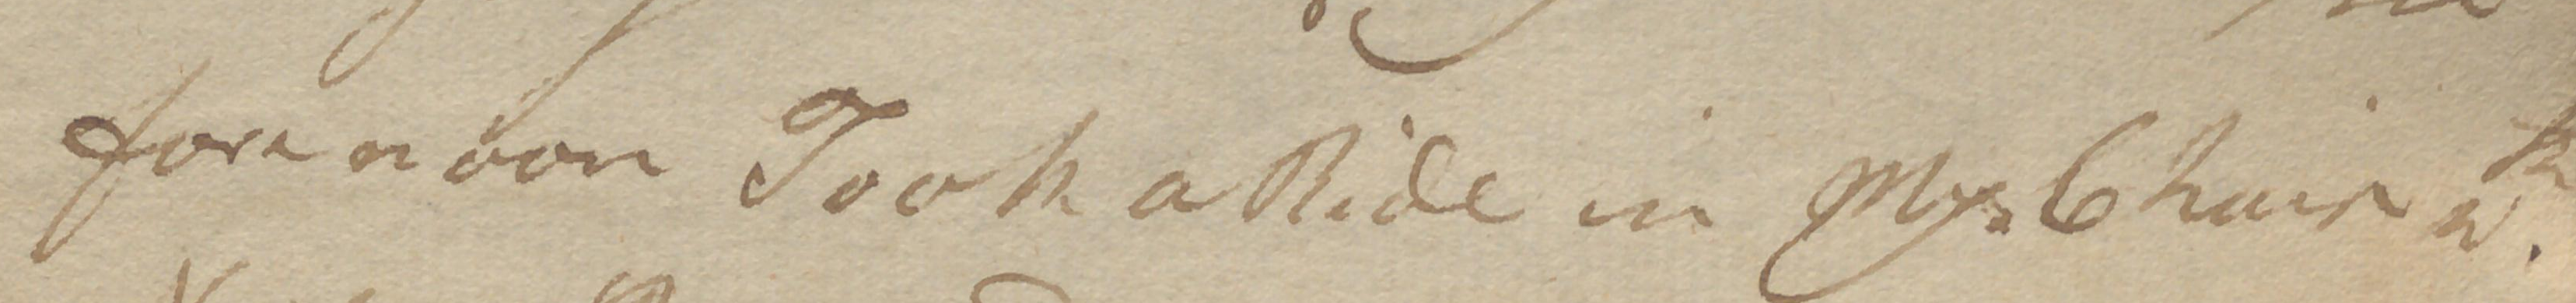forenoon Took a Ride in My. Chair w^th.
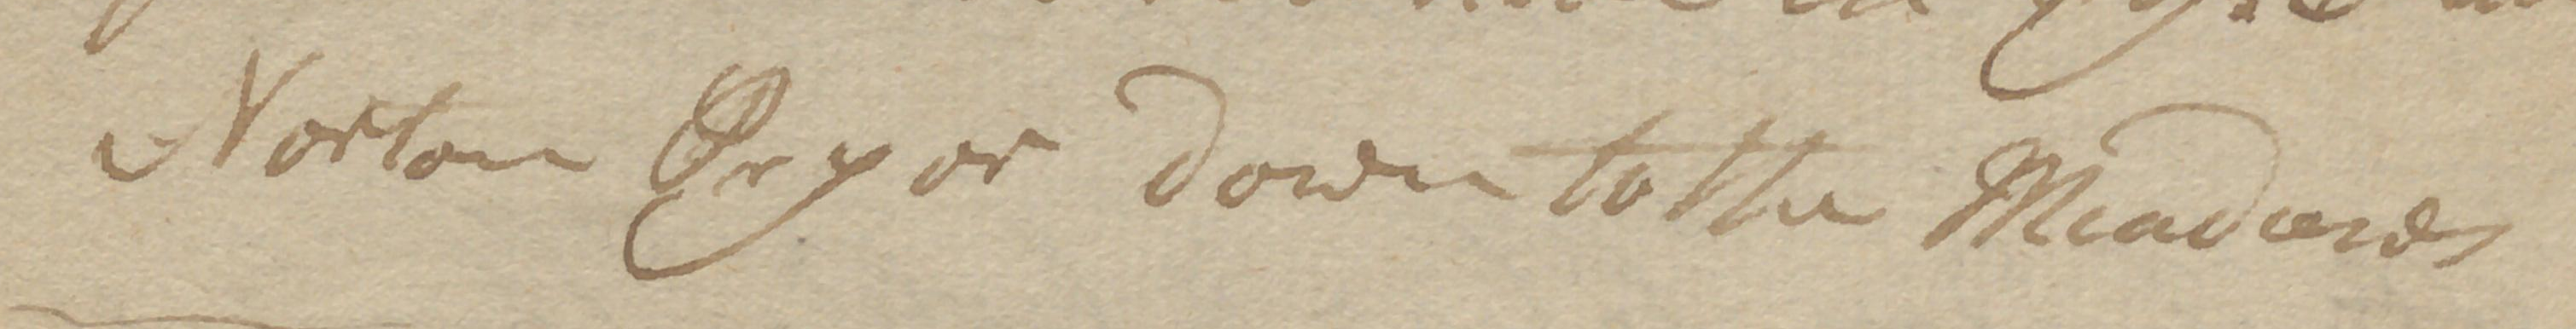Norton Pryor down to the Meadows
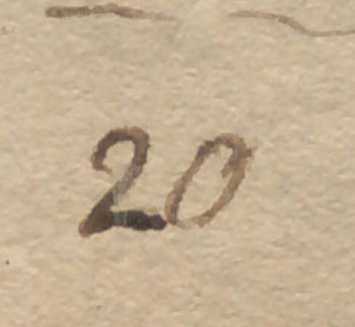20
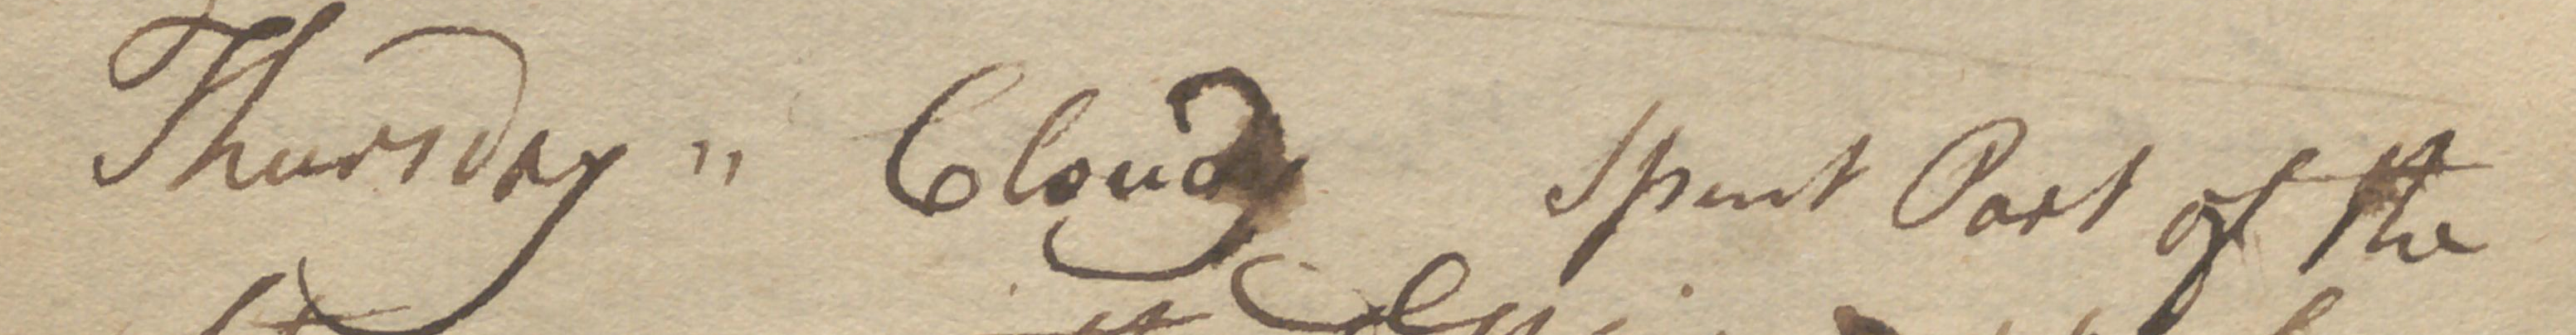Thursday.. Clouds spent Part of the
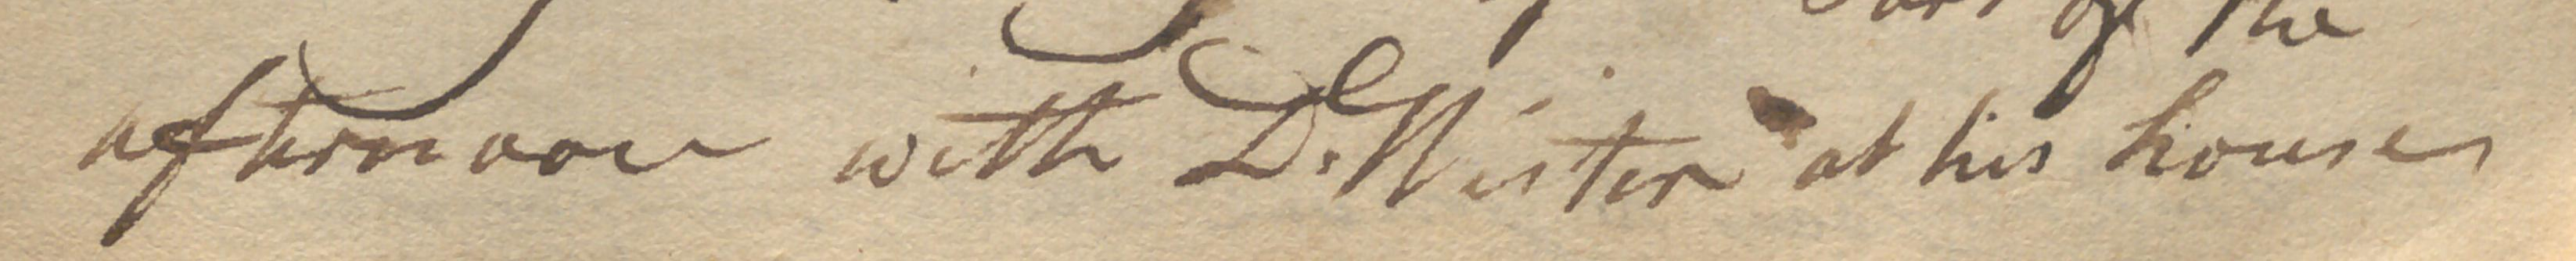afternoon with D^r. Wister at his house
